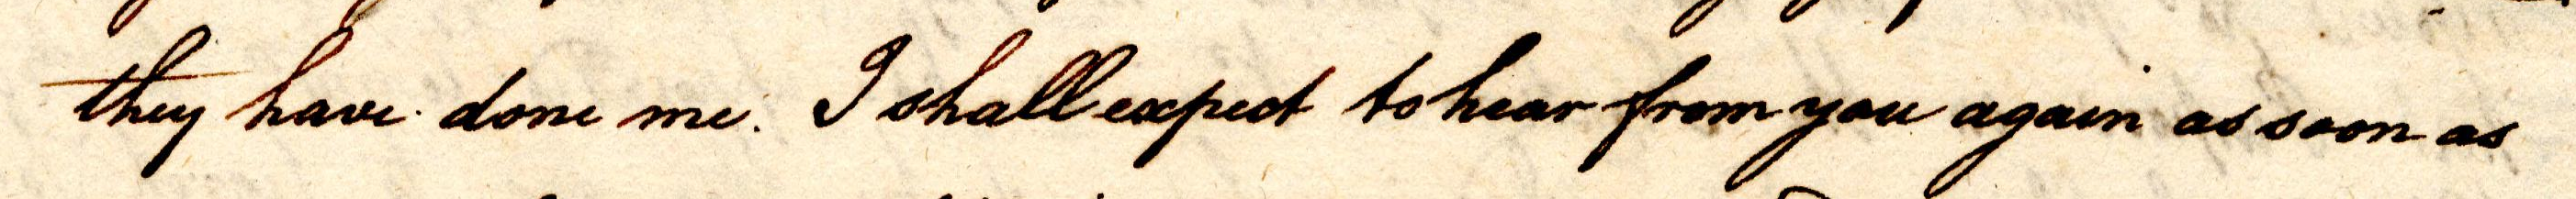they have done me. I shall expect to hear from you again as soon as
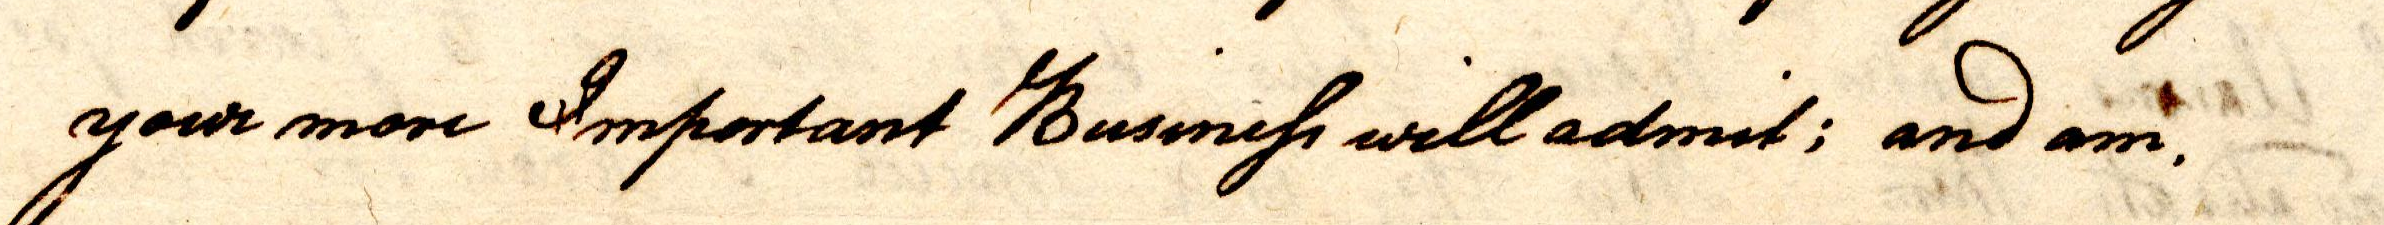your more Important Business will admit; and am,
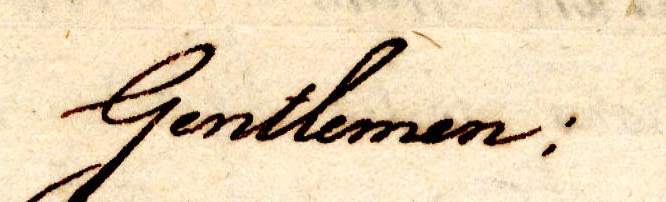Gentlemen:
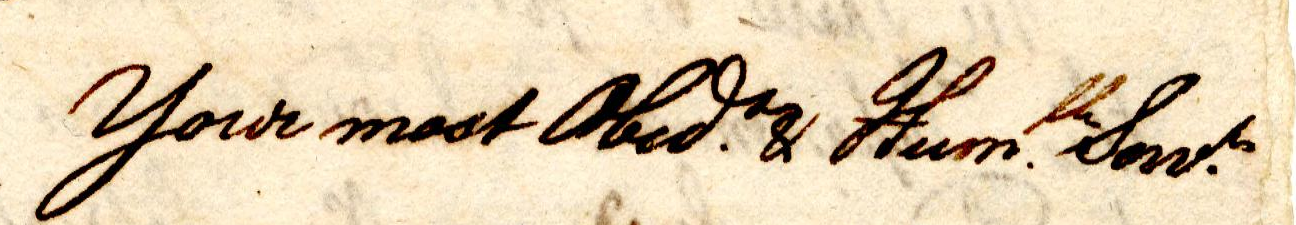Your most Obed^t. & Hum^ble. Serv^t.
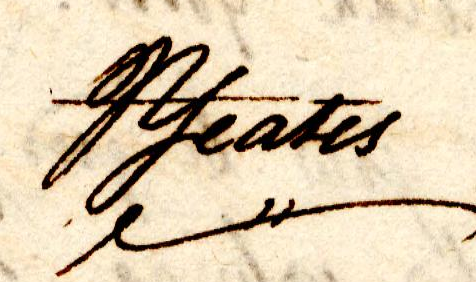J. Yeates
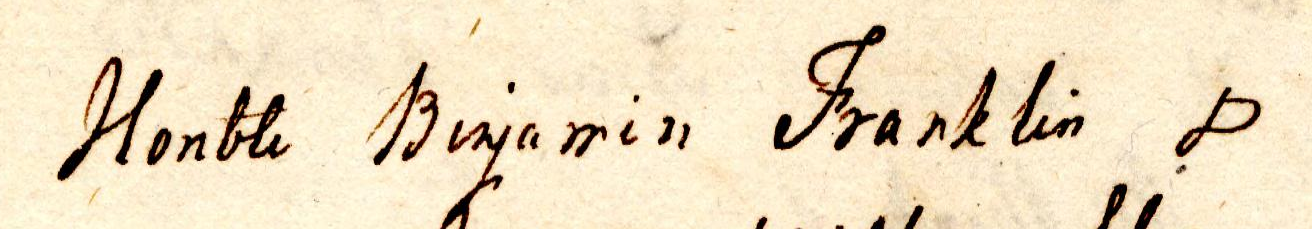Honble Benjamin Franklin &
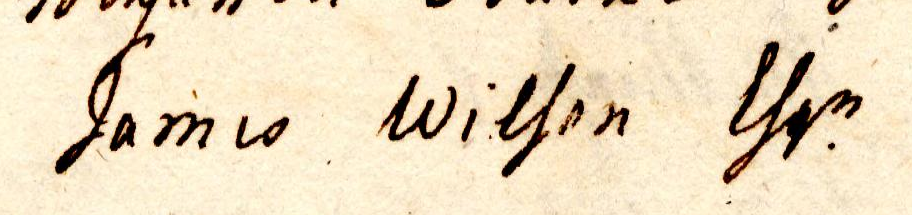James Wilson Esq^e.
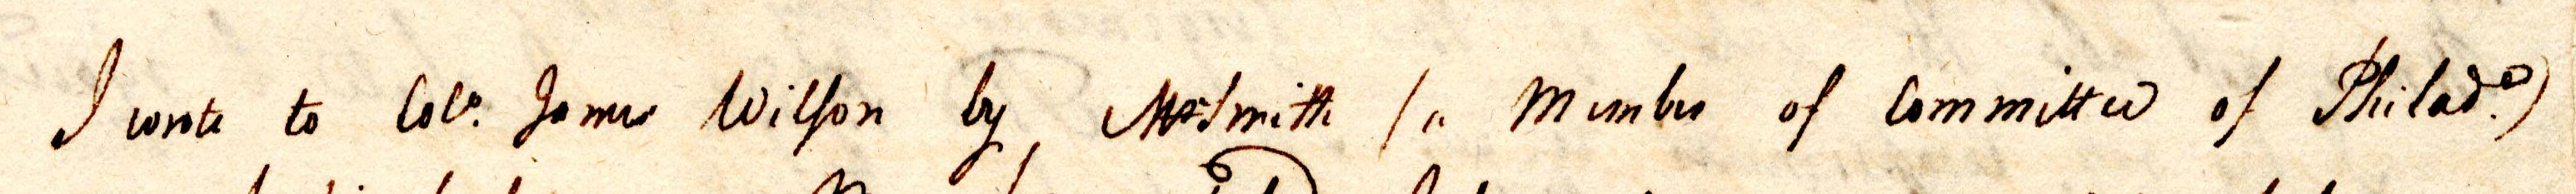I wrote to Col^o. James Wilson by M^r Smith to Members of committee of Philad^a.
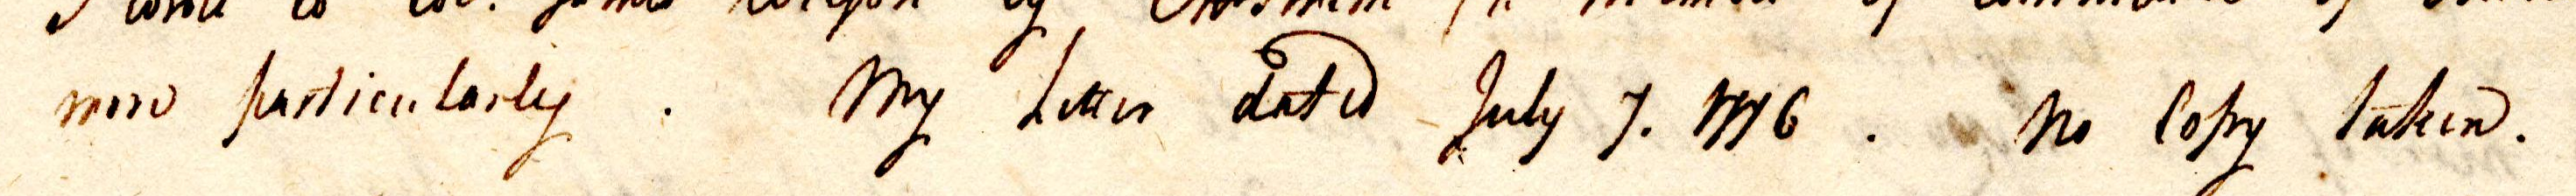more particularly. My Letter dated July 7. 1776. No Copy taken.
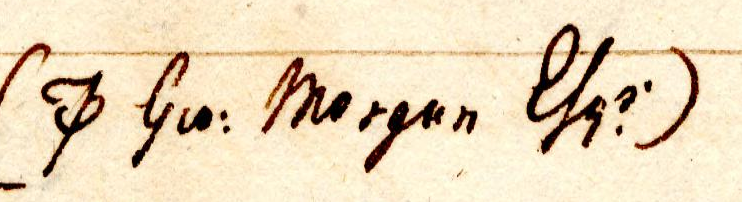(Per Geo: Morgan Esq^e.)
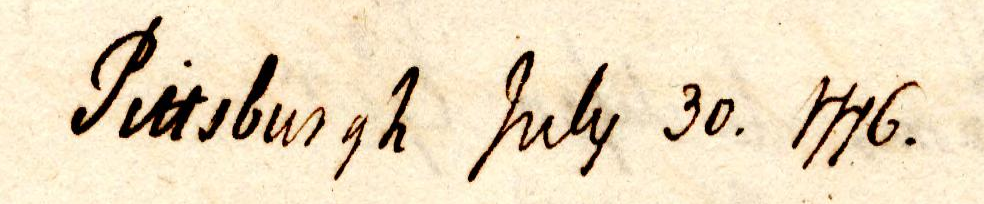Pittsburgh July 30. 1776.
